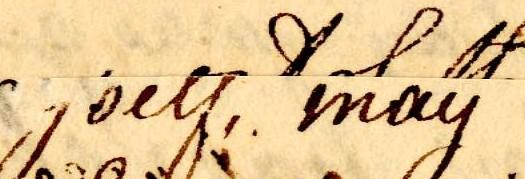yself, may
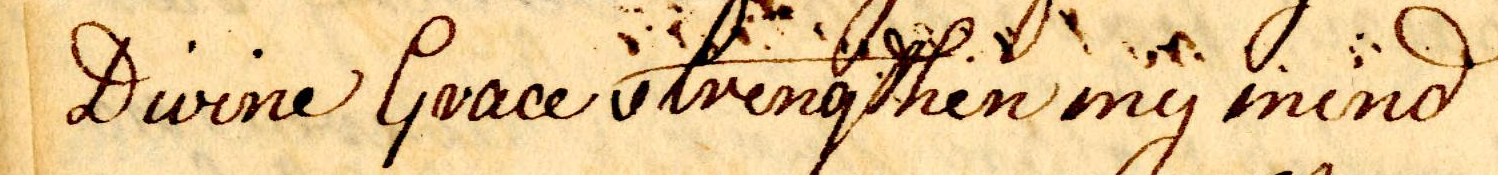Divine Grace strengthen my mind
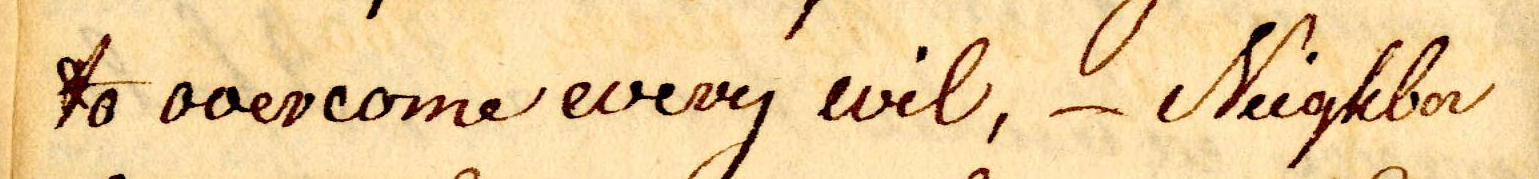to overcome every evil,- Neighbor
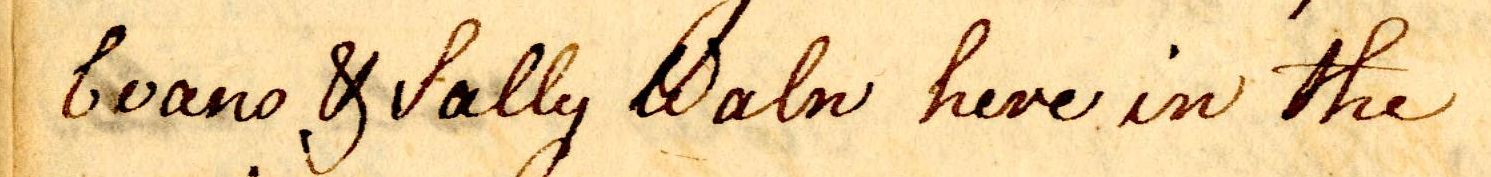Evans & Sally Waln here in the
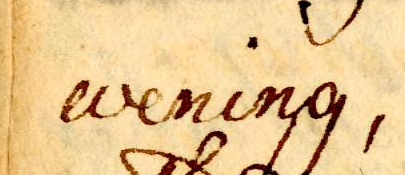evening,
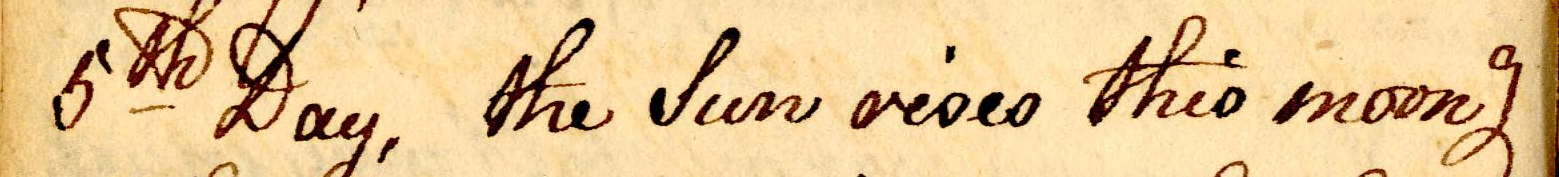5^th Day, the Sun rises this morn^g
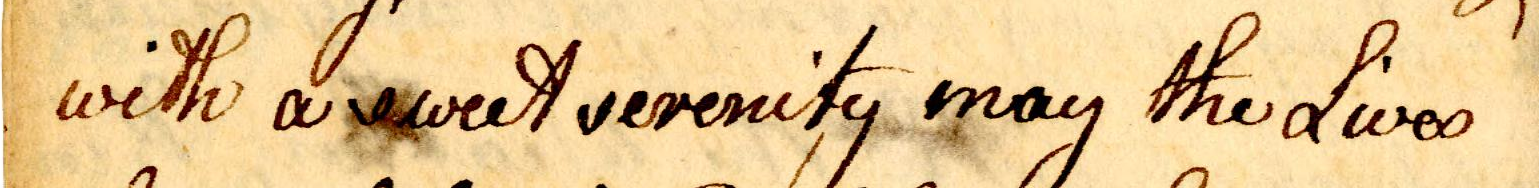with a sweet serenity may the Lives
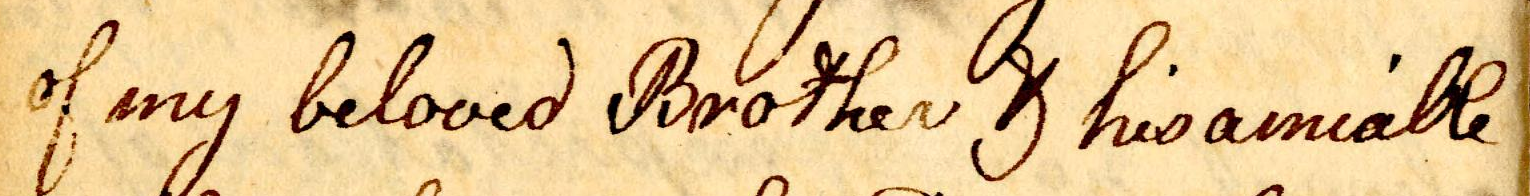of my beloved Brother & his amiable
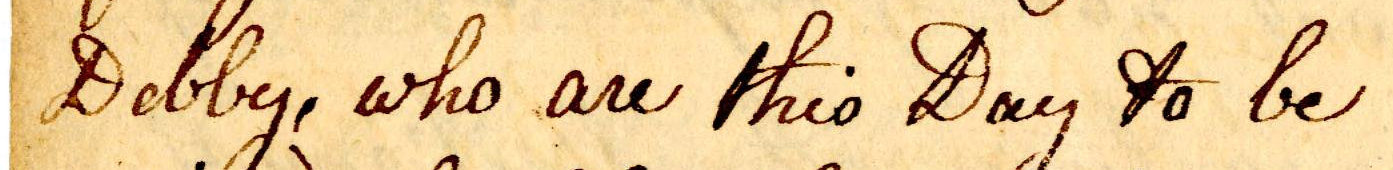Debby, who are this Day to be
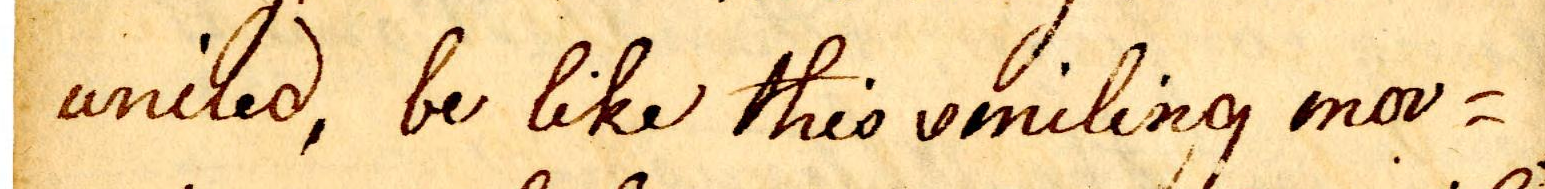united, be like smiling mor-
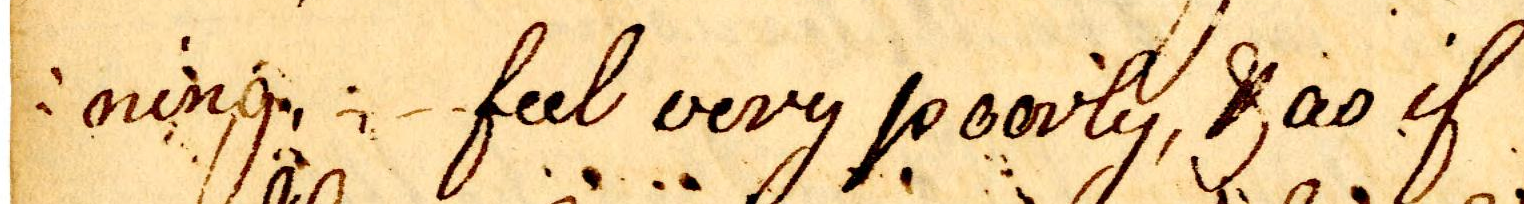-ning, feel very poorly & has if
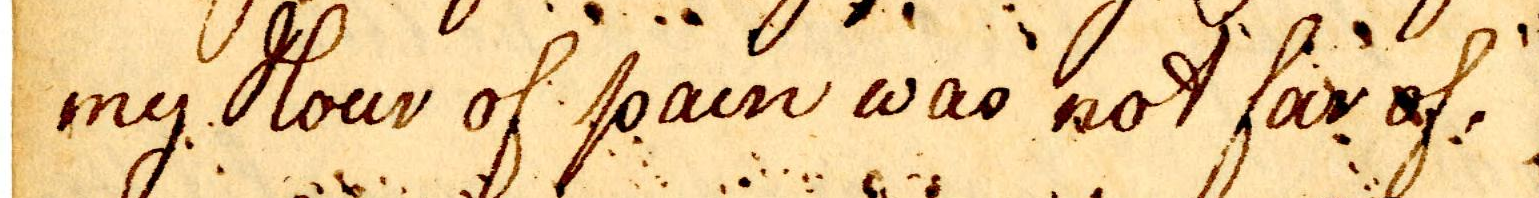my Hour of pain was not far of
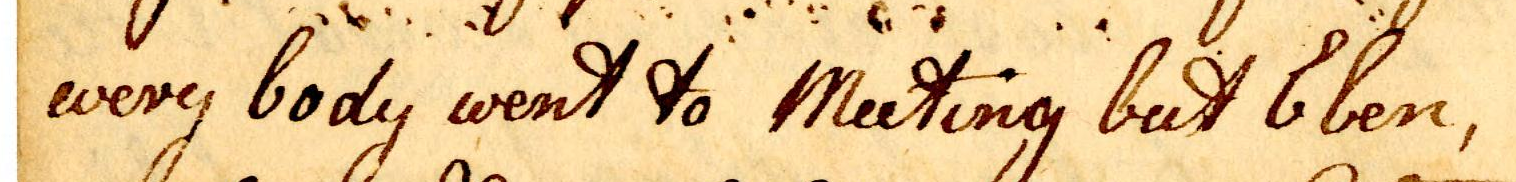every body went to Meeting but Eben,
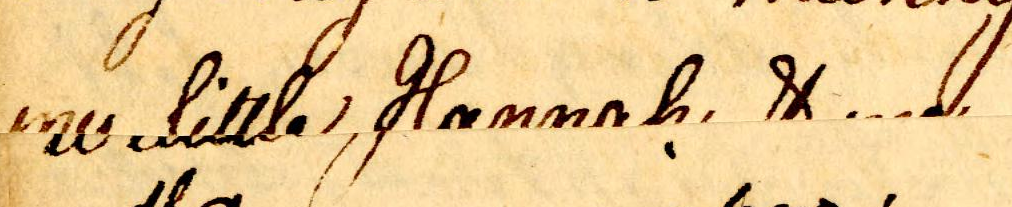my little Hannah & [my]
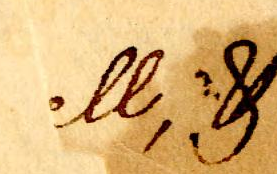ell, &
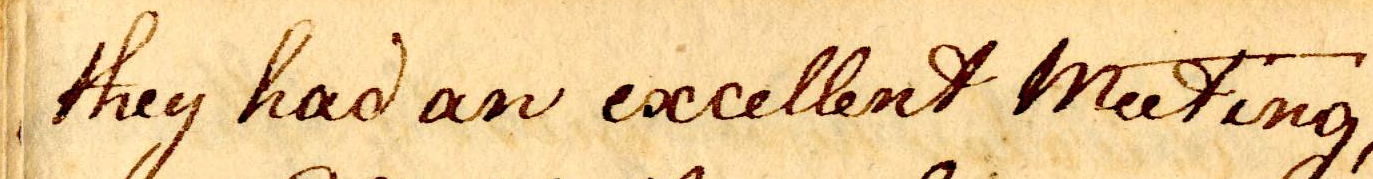they had an excellent Meeting,
